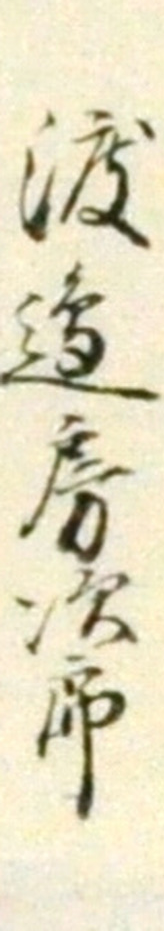渡邊房次郎
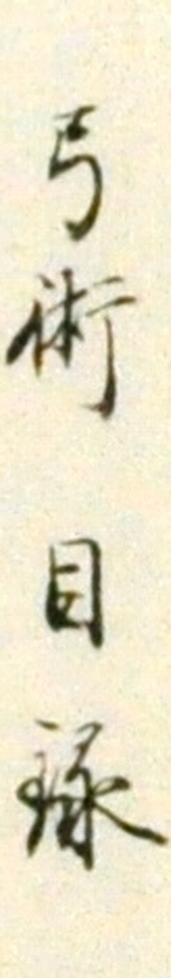弓術目録
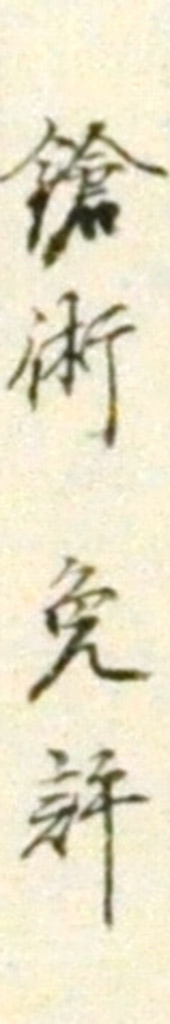鎗術免許
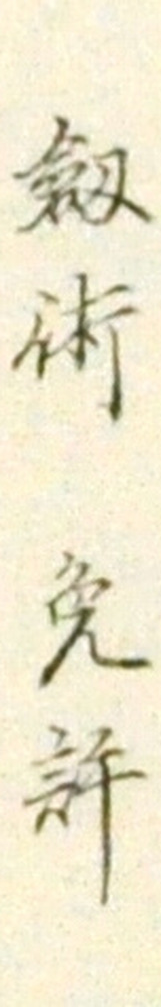馬術免許
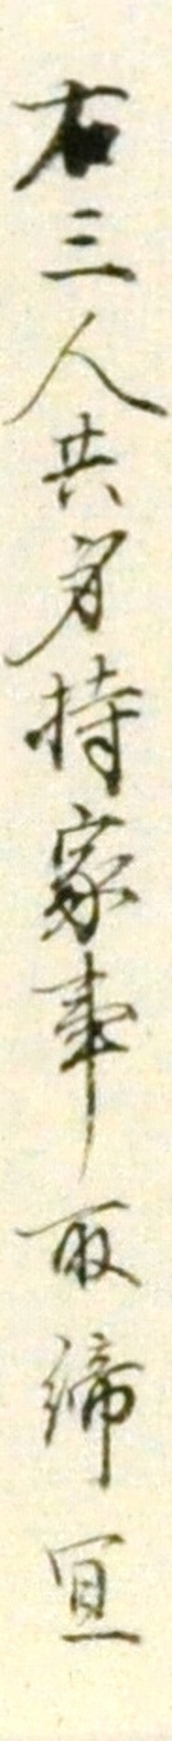右三人共身持家事取締宜
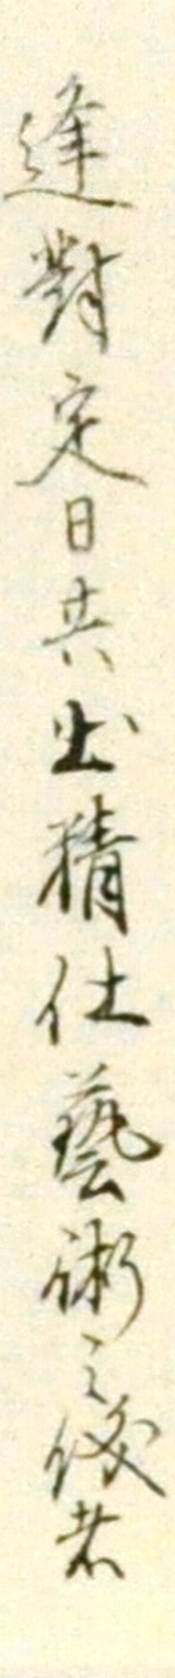逢対定日共出精仕芸術之儀者
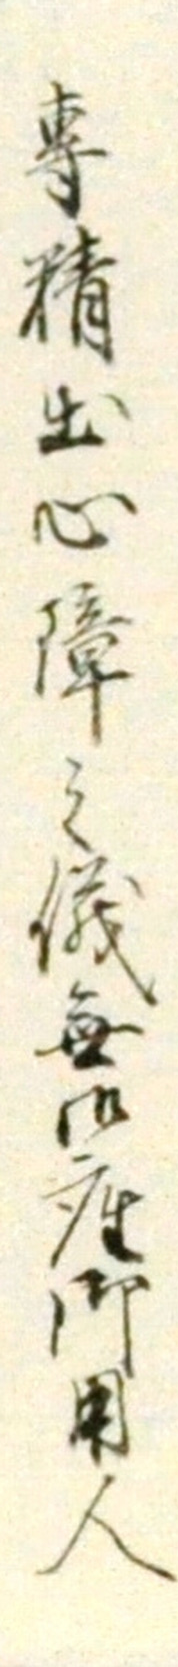専精出心障之儀無御座御用人
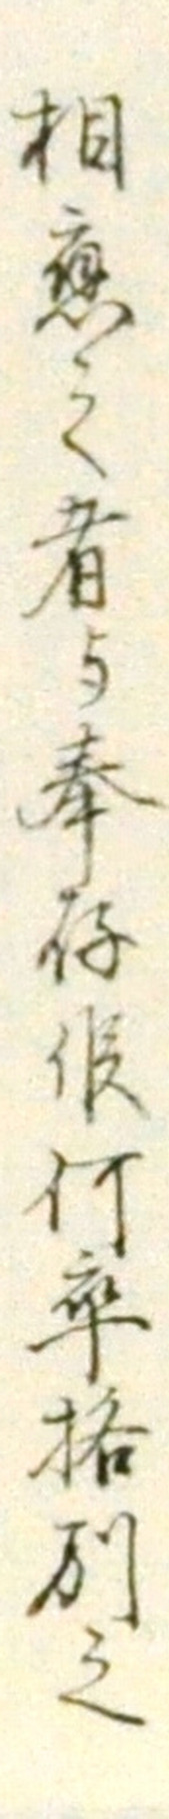相応之者と奉存候何卒格別之
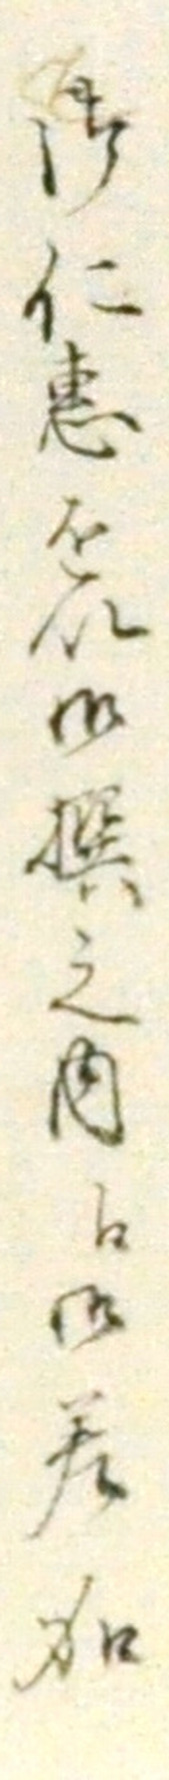御仁恵を以御撰之内江御差加
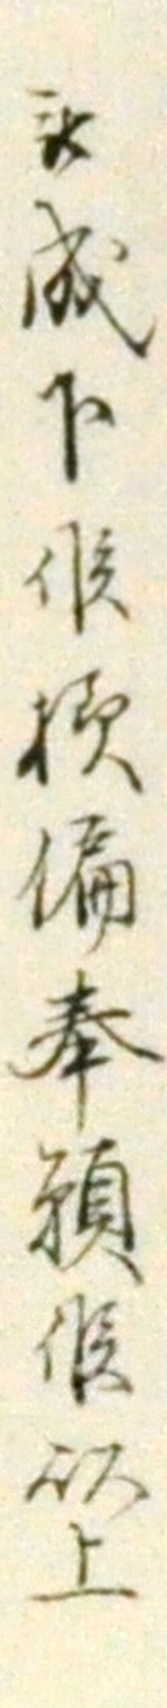被成下候様偏奉願候以上
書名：右大将様御書院番御用人見込書付
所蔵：伊那市立高遠町図書館・合同会社AMANE
